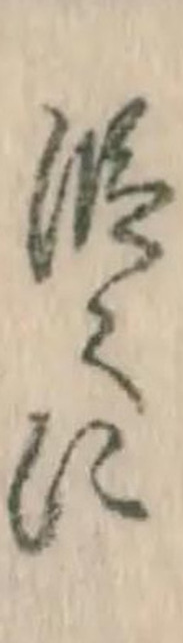段々に
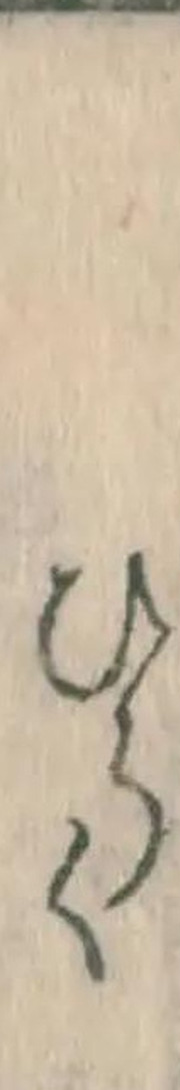ひらく
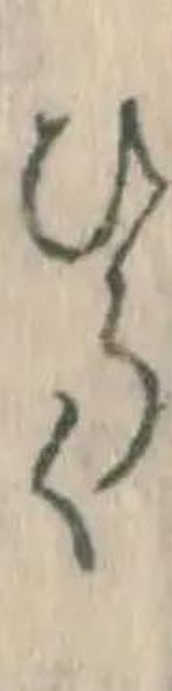ひらく
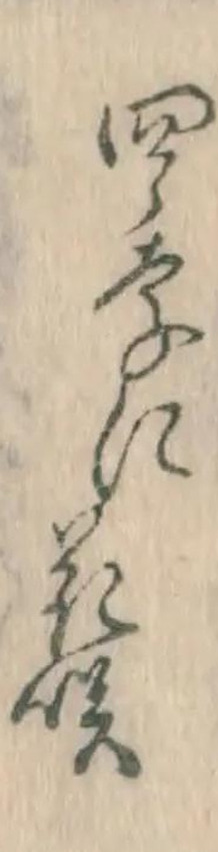四字に花咲
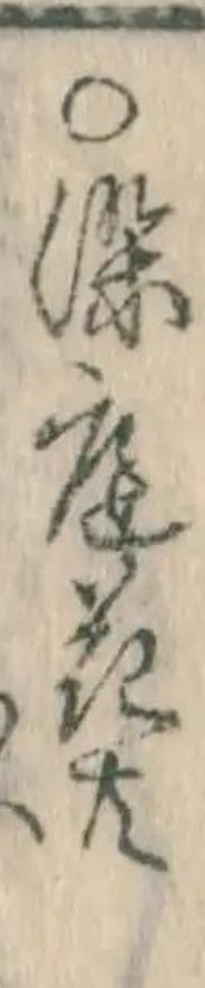〇染庭花共
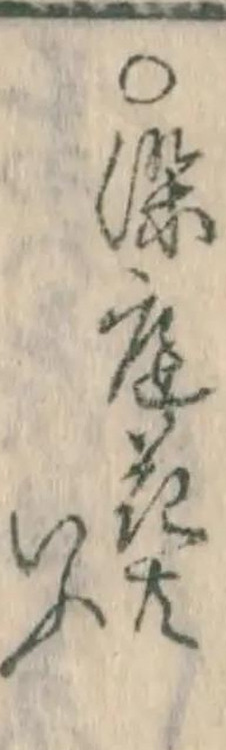〇染庭花共

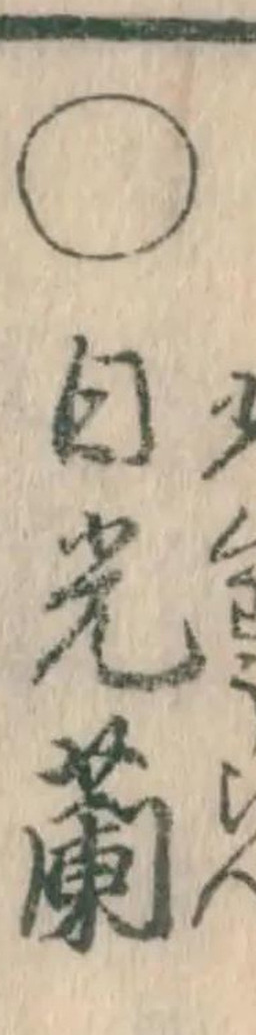〇日光蘭
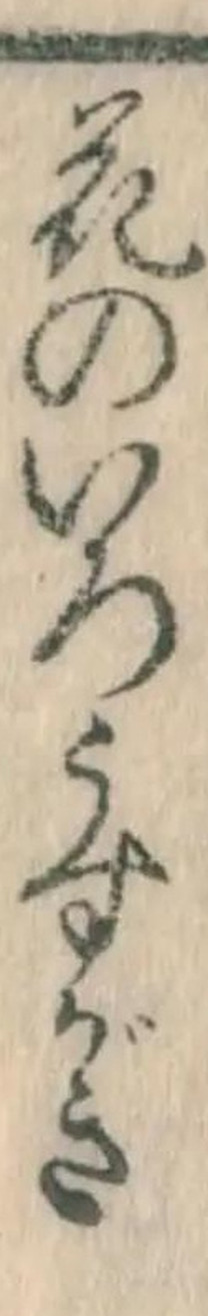花のいろうすが？き
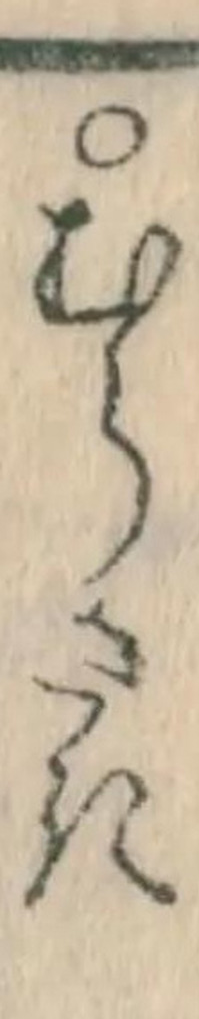〇むらさき
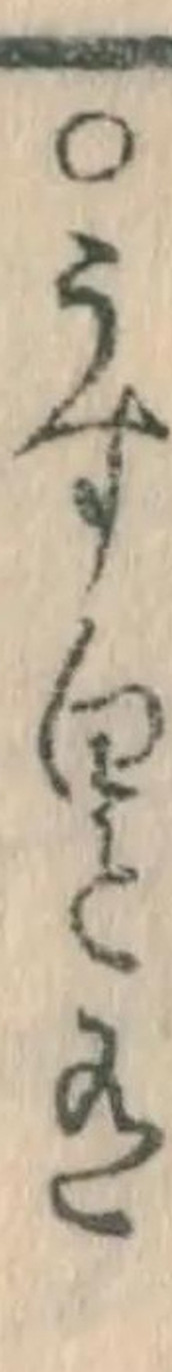〇うす白と有
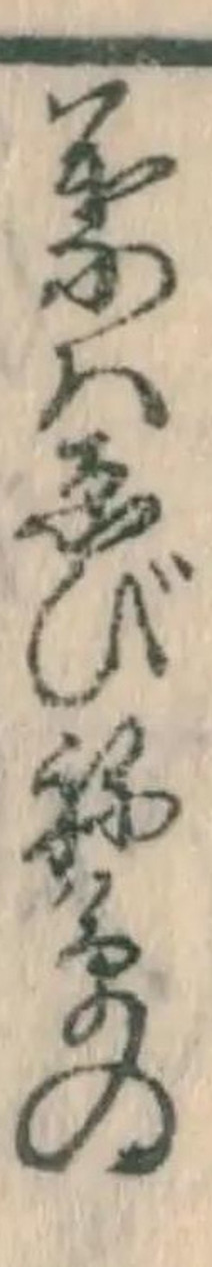葉はゑびね草の
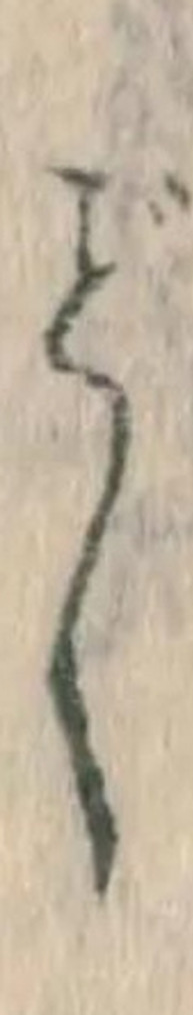ごとく
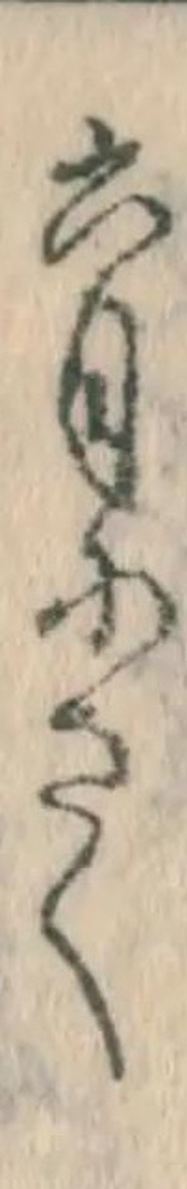六月にさく
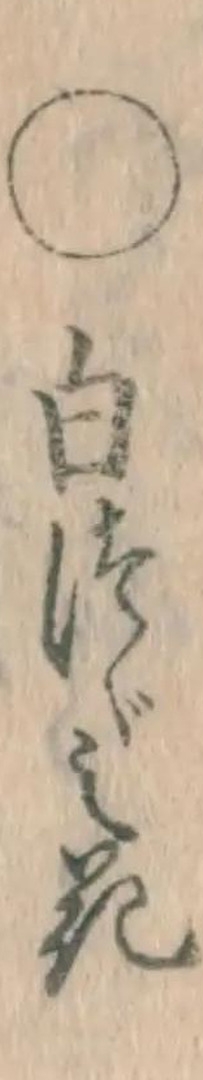〇白つゞ之花
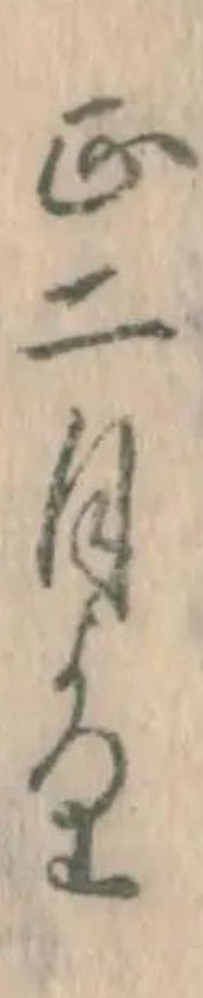正二月より
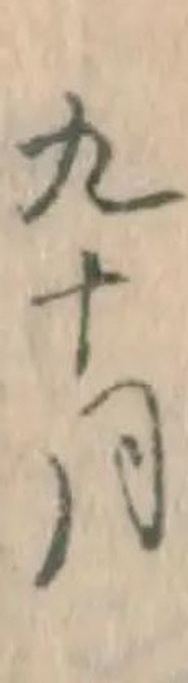九十月
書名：艸花繪前集. [1]
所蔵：国立国会図書館 National Diet Library, JAPAN
